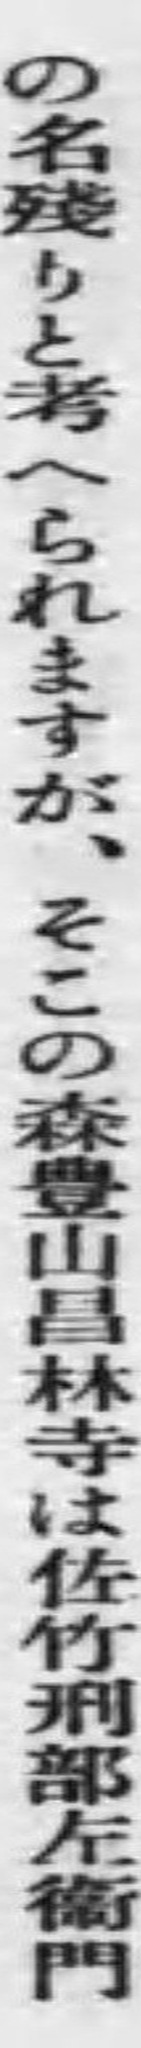の名残りと考へられますが、そこの森豊山昌林寺は佐竹刑部左衛門
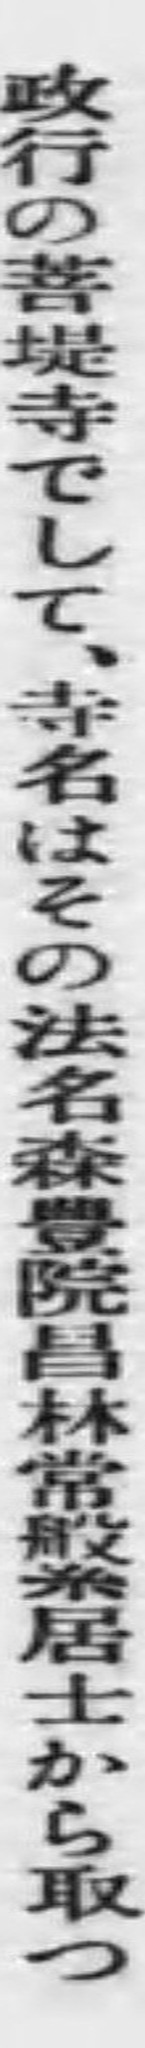政行の菩堤寺でして、寺名はその法名森豊院昌林常縏居士から取つ
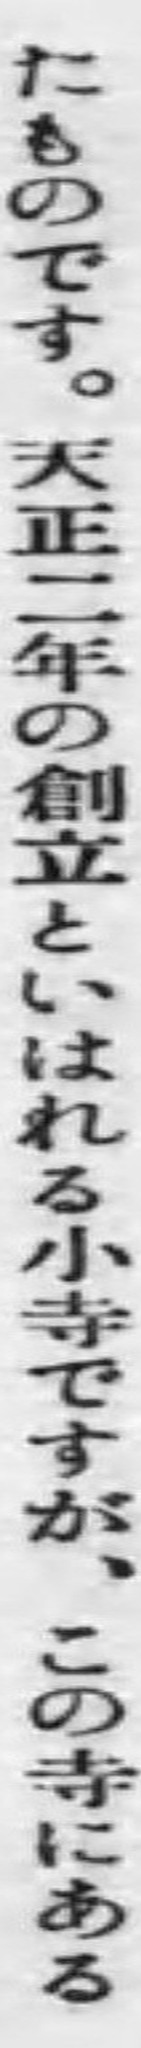たものです。天正二年の創立といはれる小寺ですが、この寺にある
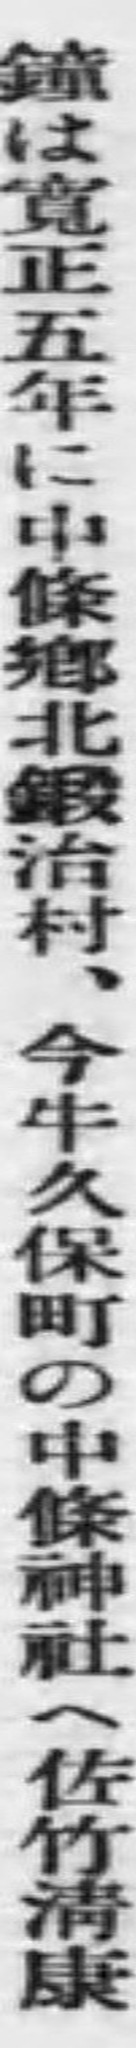鎌は寛正五年に中条郷北鍛治村、今牛久保町の中条神社へ佐竹清康
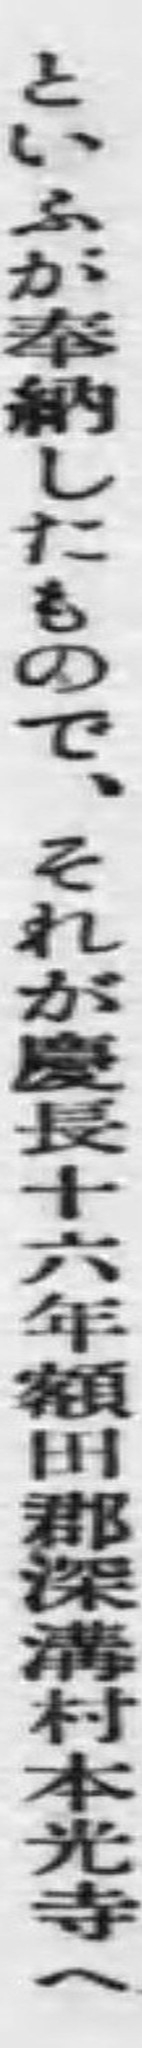といふが奉納したもので、それが慶長十六年額田郡深溝村本光寺へ
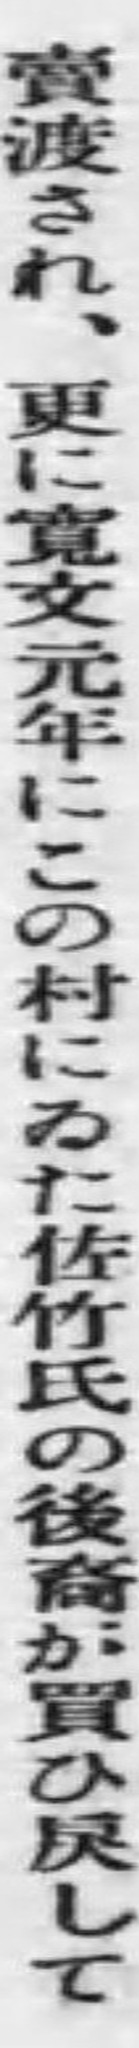売渡され、更に寛文元年にこの村にゐた佐竹氏の後裔が買ひ戻して
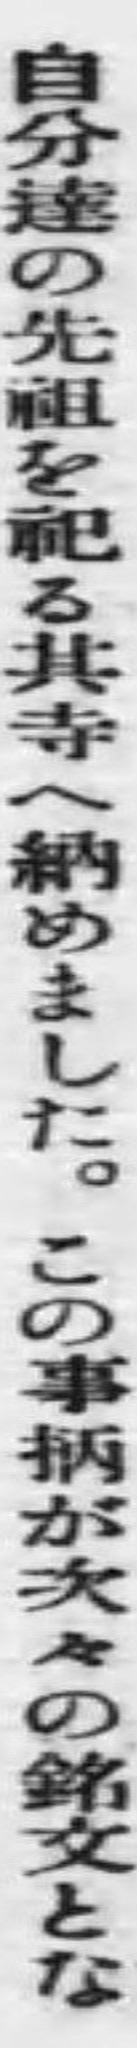自分達の先祖を祀る其寺へ納めました。この事抦が次々の銘文とな
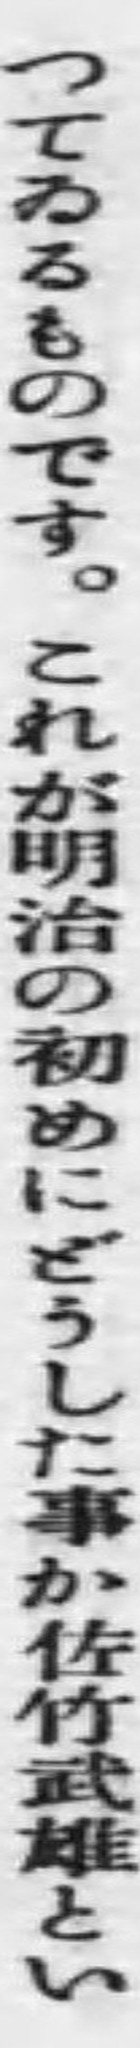つてゐるものです。これが明治の初めにどうした事か佐竹武雄とい
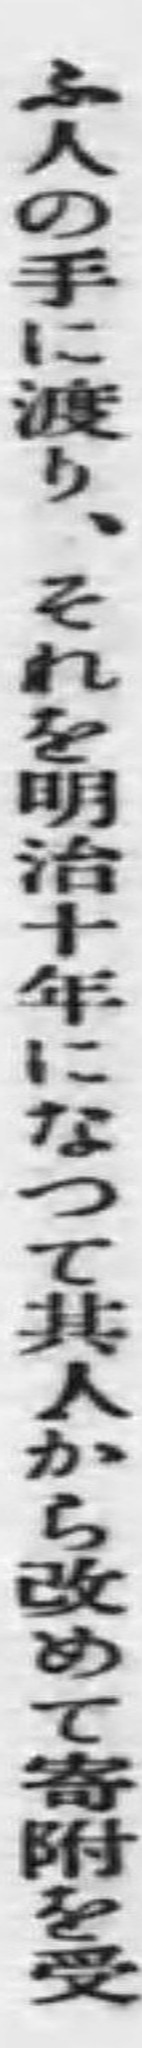ふ人の手に渡り、それを明治十年になつて其人から改めて寄附を受
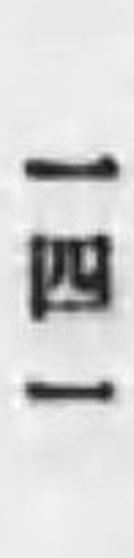一四一

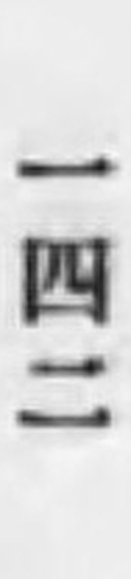一四二
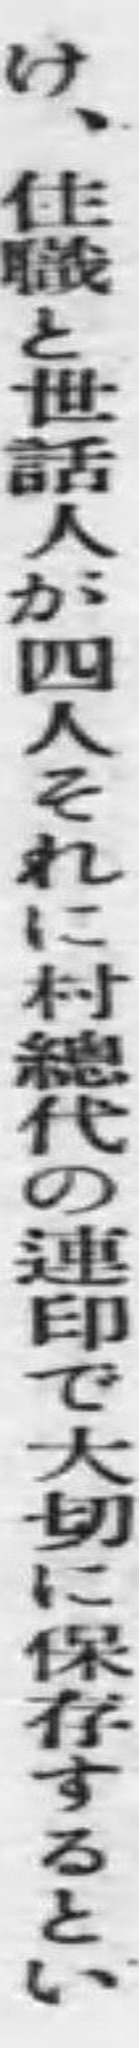け、住職と世話人が四人それに村総代の連印で大切に保存するとい
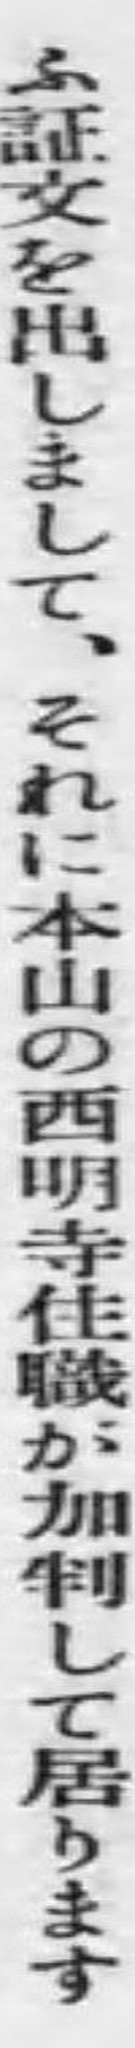ふ証文を出しまして、それに本山の西明寺住職が加判して居ります
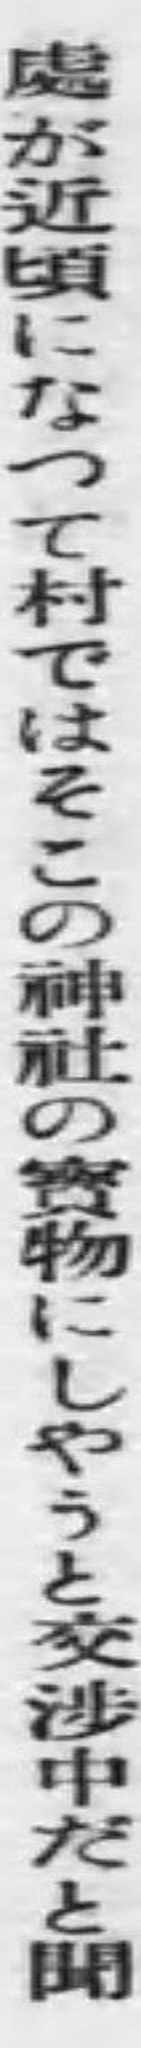処が近頃になつて村ではそこの神社の宝物にしやうと交渉中だと聞
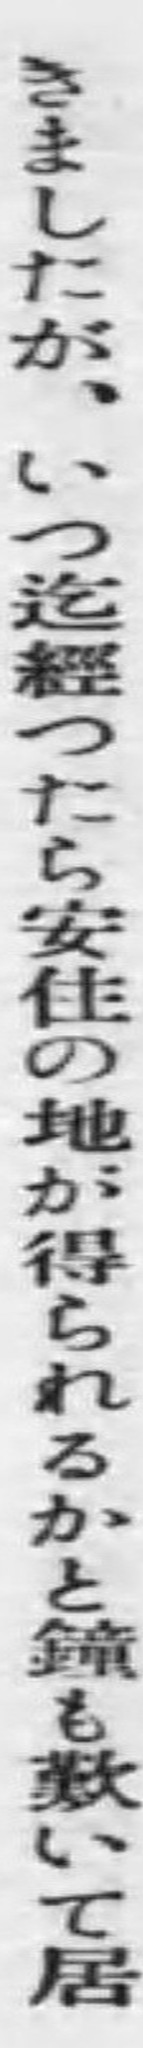きましたが、いつ迄経つたら安住の地が得られるかと鐘も歎いて居
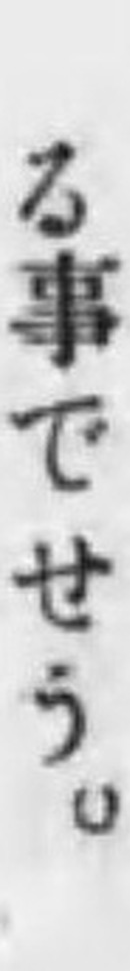る事でせう。
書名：東三河道中記 : 豊橋市及其附近案内
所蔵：国立国会図書館 National Diet Library, JAPAN
